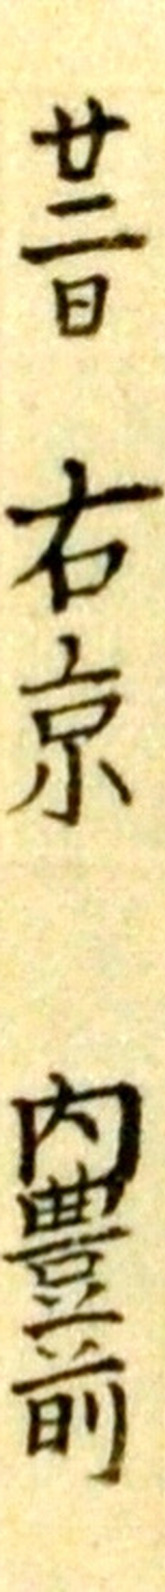廿ニ日右京内豊前
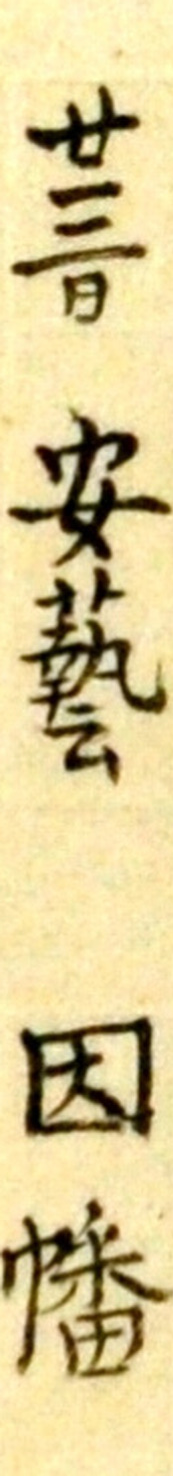廿三日安芸因幡
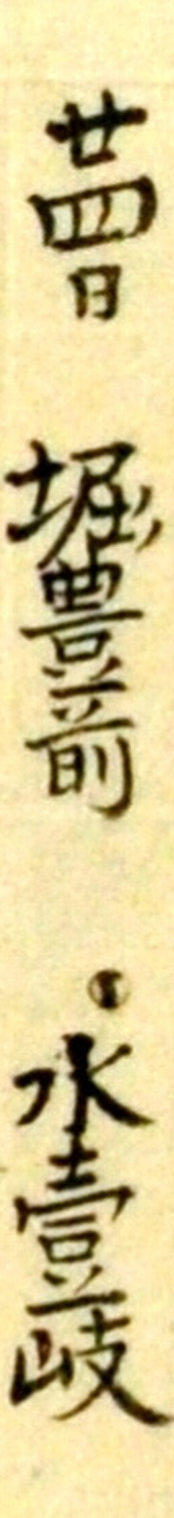廿四日堀豊前水壱岐
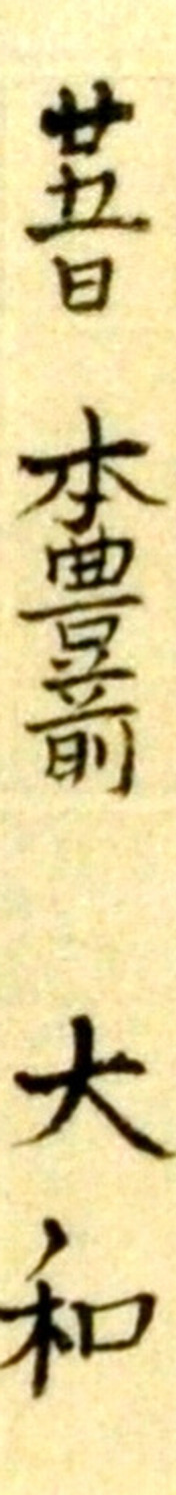廿五日本豊前大和
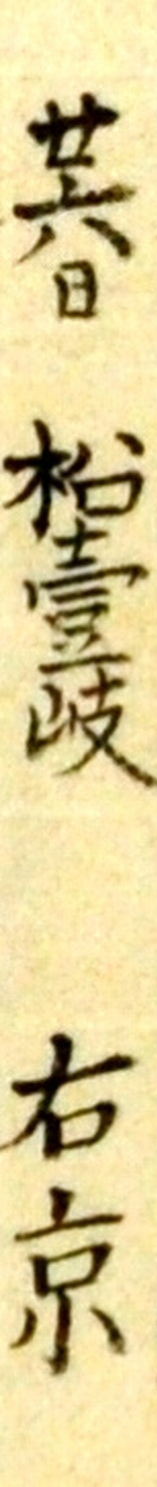廿六日松壱岐右京
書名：六月・八月詰日一覧
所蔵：伊那市立高遠町図書館・合同会社AMANE
